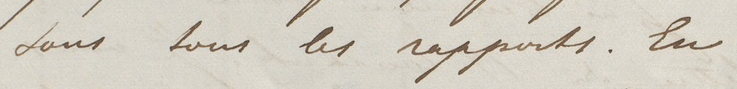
sous tous les rapports. En
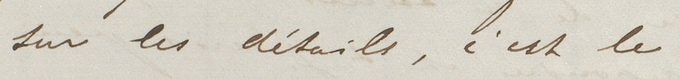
sur les détails, c'est le
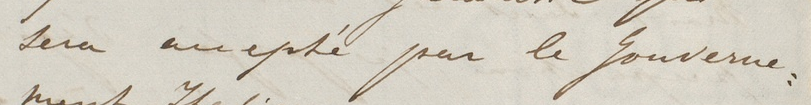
sera accepté par le Gouverne-
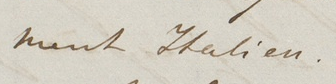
ment Italien.
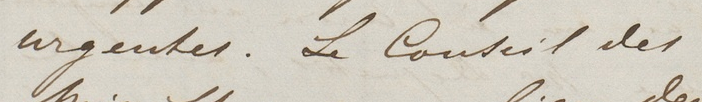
urgentes. Le Conseil des
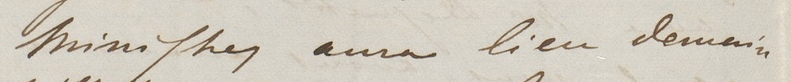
Ministres aura lieu demain
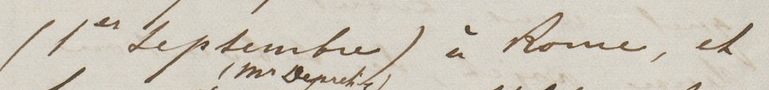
(1er Septembre) à Rome, et
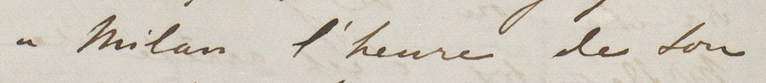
a Milan l'heure de son
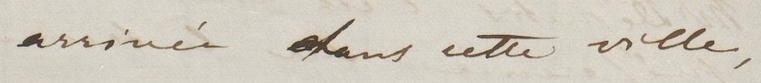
arrivée dans cette ville,
